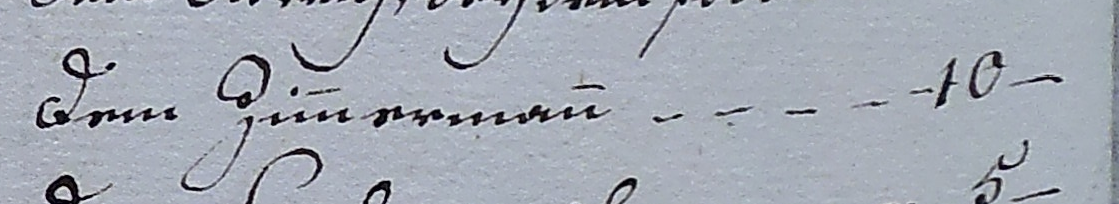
Dem Zim̅erman̅ .. .. .. .. .. 10 -
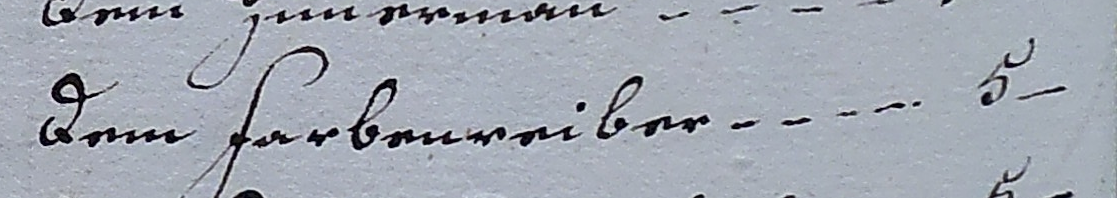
Dem Farbenreiber .. .. .. ... 5 -
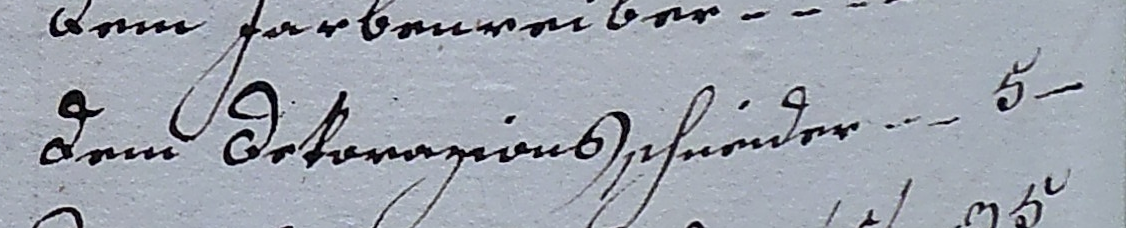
Dem Dekorazionsschneider ....5 -
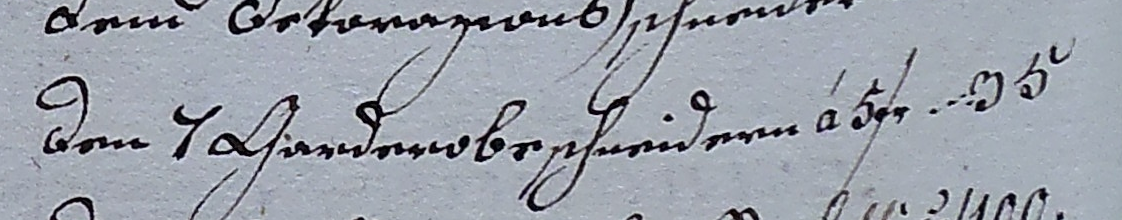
Den 7 Garderobescheidern à 5fr ...35
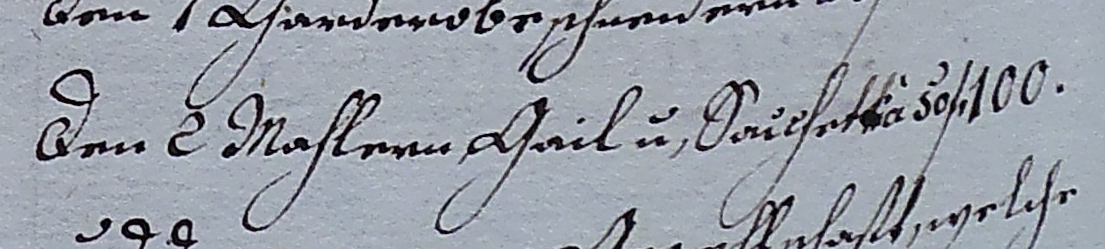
Den 2 Mahlern Gail u, Sacchetti à fr100.
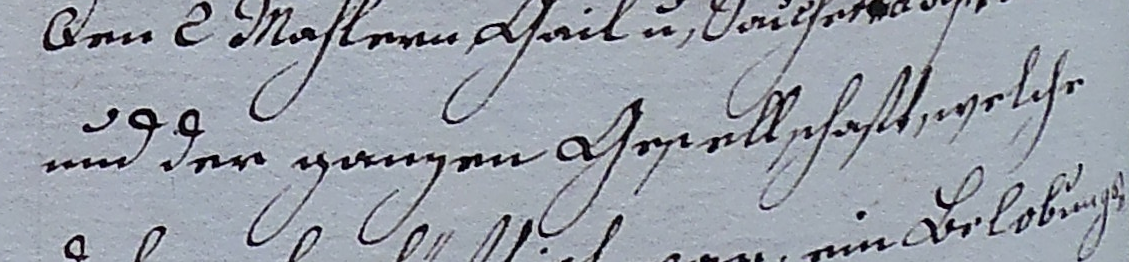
und der ganzen Gesellschaft, welche
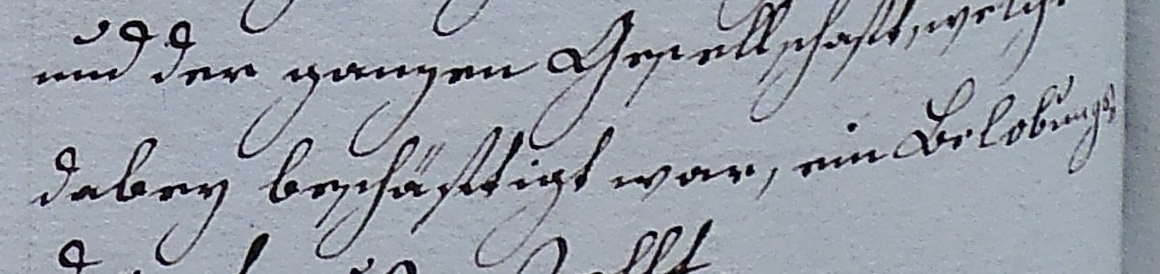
dabey beschäftigt war, ein Belobungs¬
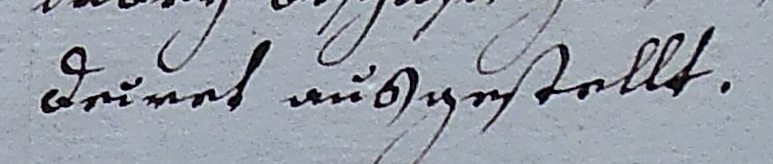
decret ausgestellt.
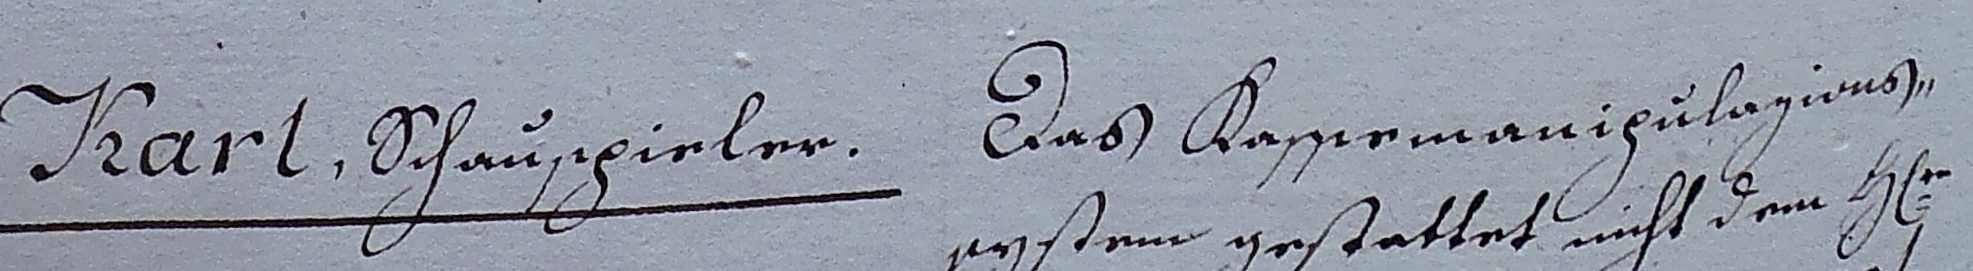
Karl, Schauspieler. Das Kassemanipulazions¬
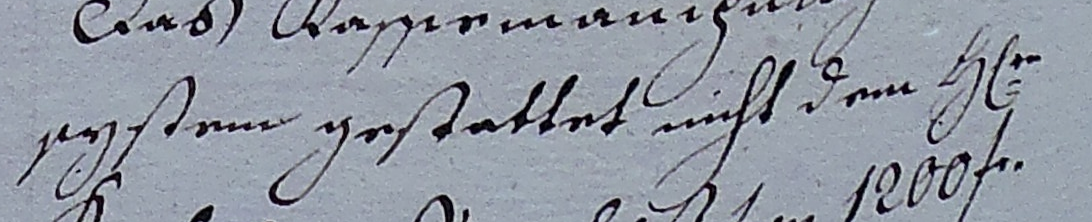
system gestattet nicht dem HEr͇n
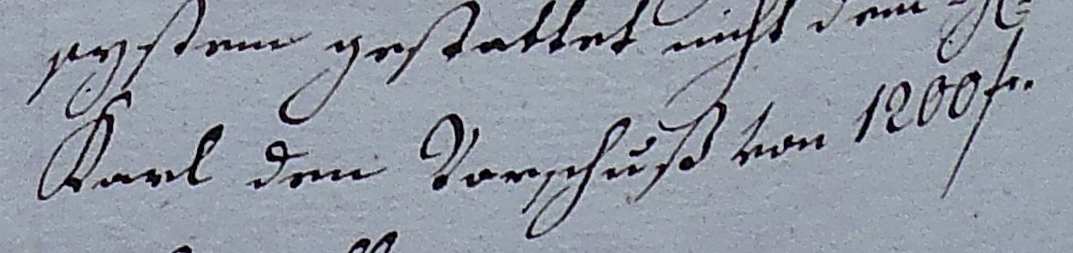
Karl den Vorschuß von 1200fr.
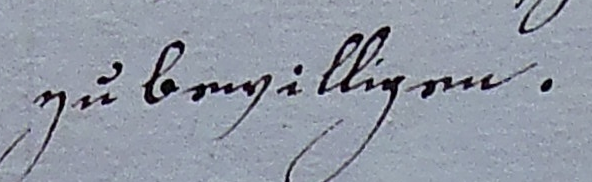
zu bewilligen.
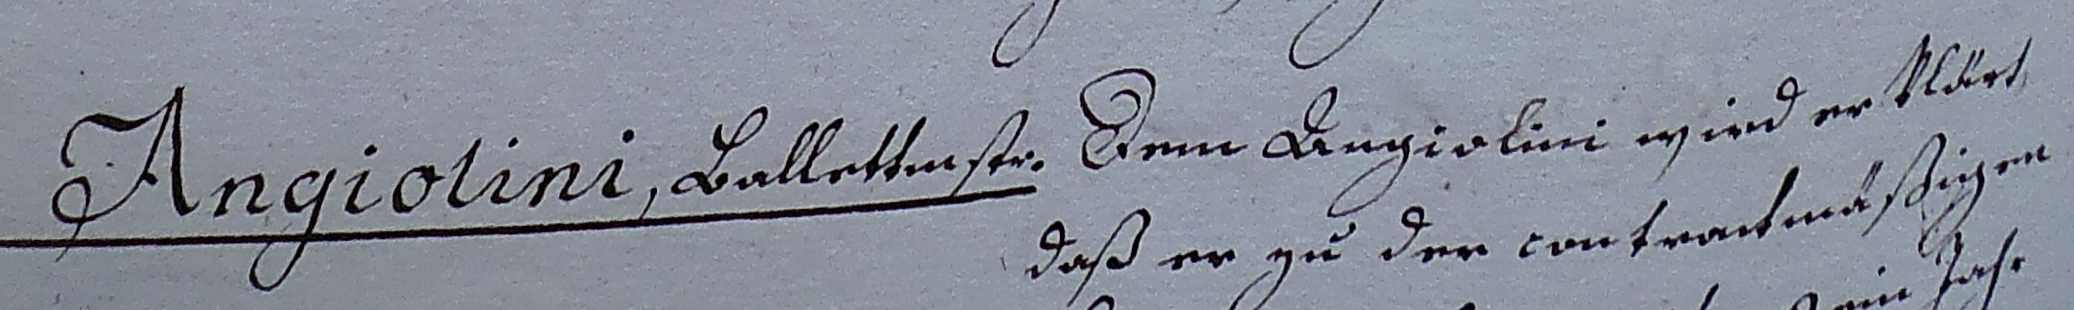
Angiolini, Ballettmstr. Dem Angiolini wird erklärt,
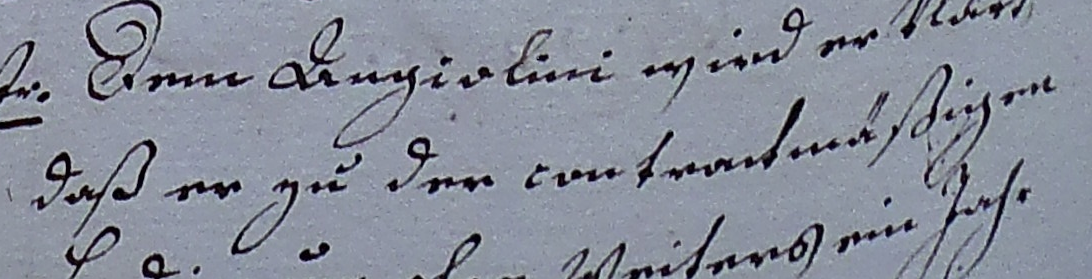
daß er zu der contractmäßigen
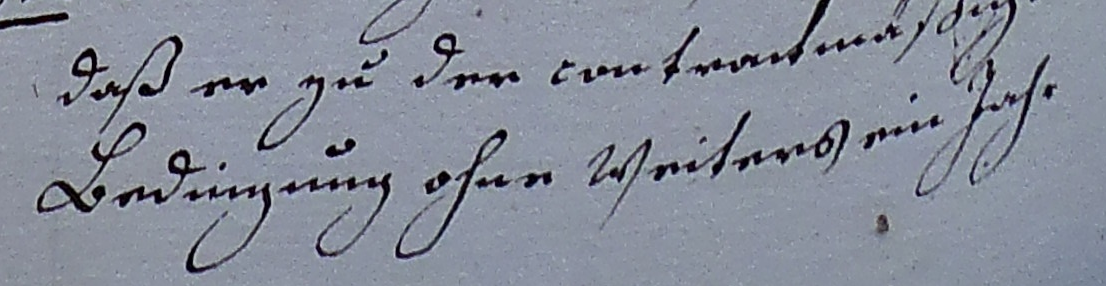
Bedingung ohne Weiters ein Jahr
